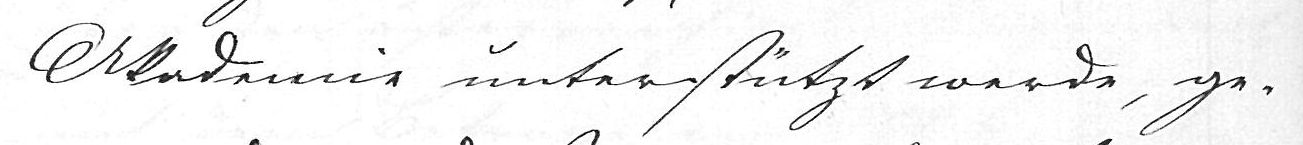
Akademie unterstützt werde, ge-
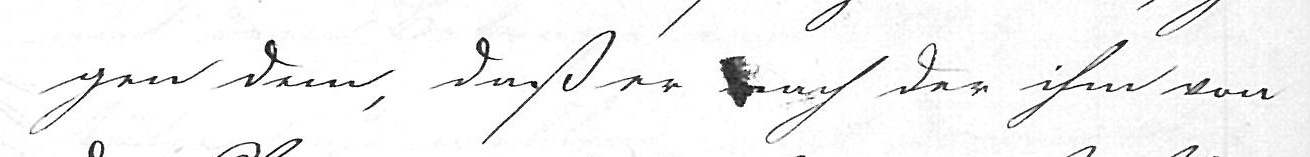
gen dem, daß er nach der ihm von
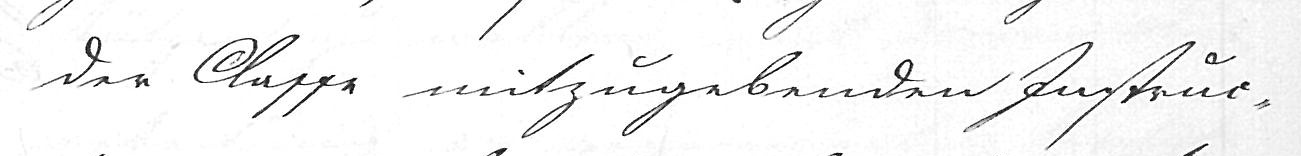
der Classe mitzugebenden Instruc-
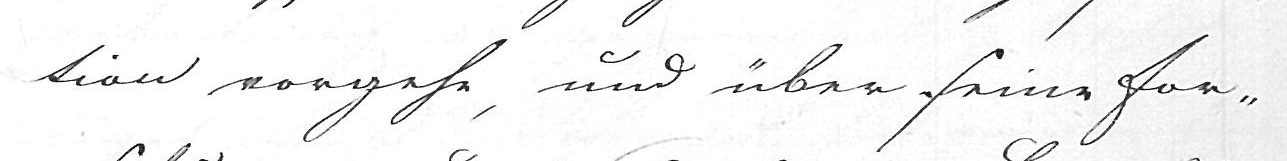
tion vorgehe und über seine For-
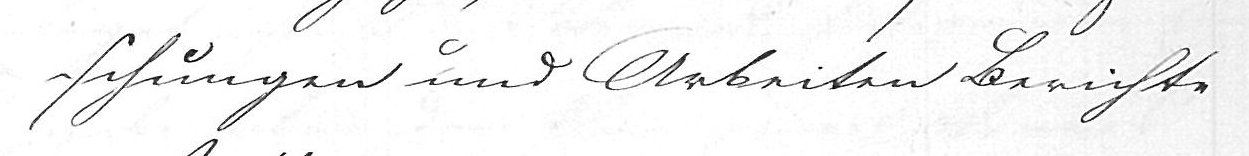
schungen und Arbeiten Berichte
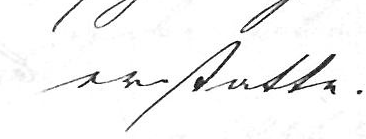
erstatte.
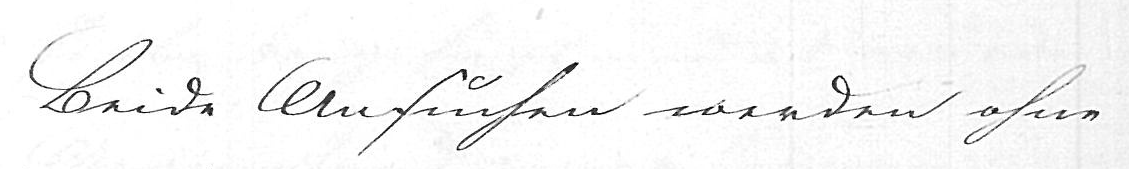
Beide Ansuchen werden ohne
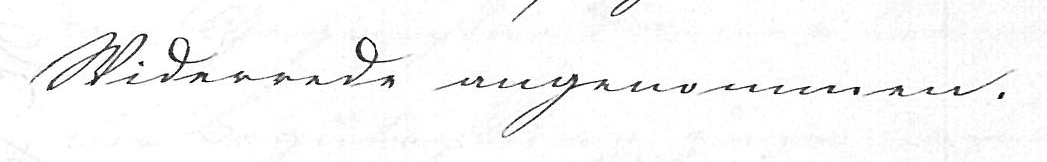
Widerrede angenommen.
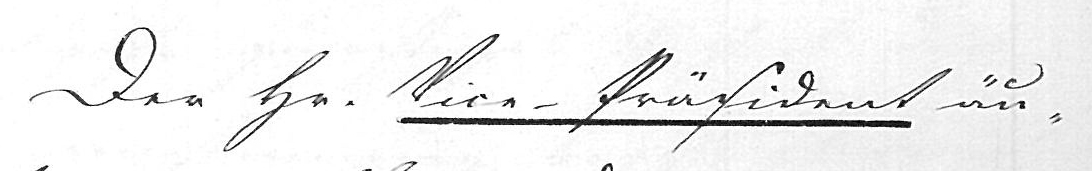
Der Hr. Vice-Präsident äu-
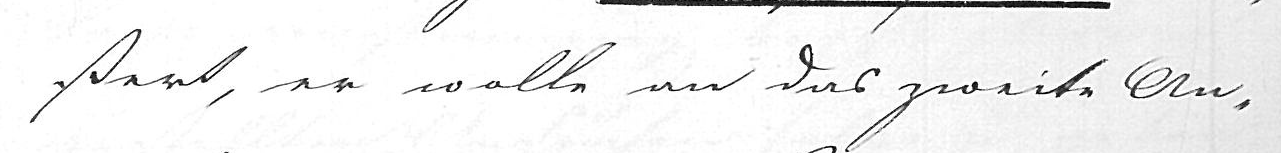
ßert, er wolle an das zweite An-
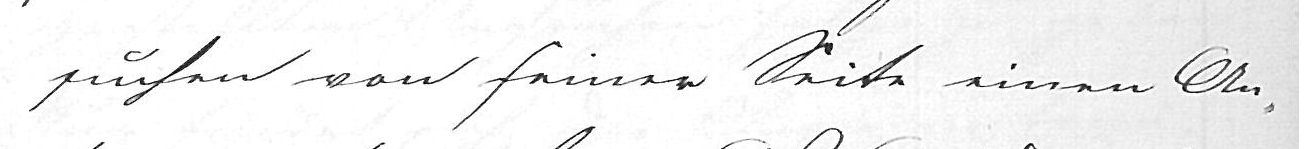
suchen von seiner Seite einen An-
